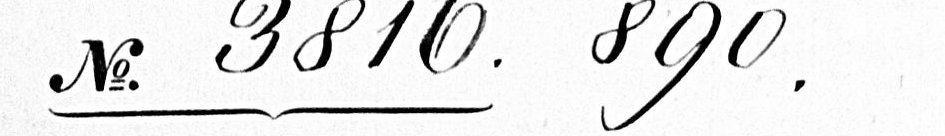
N° 3816. 890.
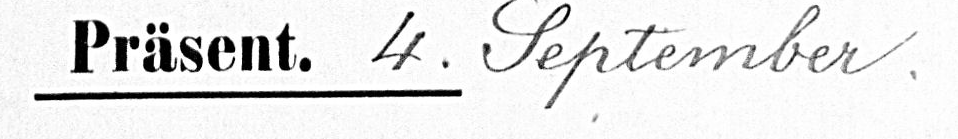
Präsent. 4. September.
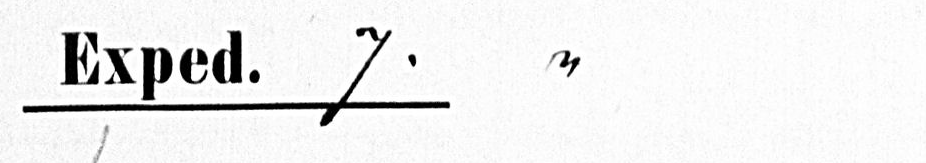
Exped. 7. September.
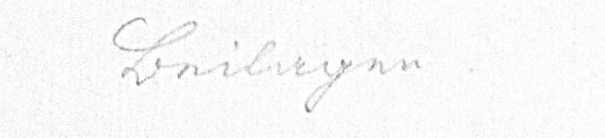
Beilagen
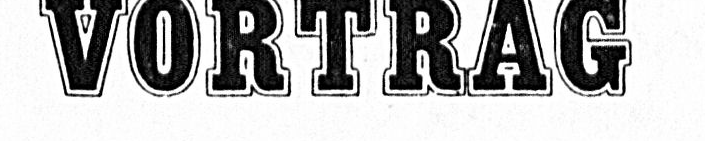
VORTRAG
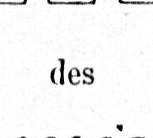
des
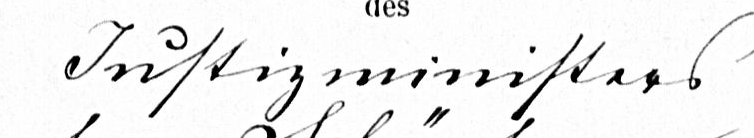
Justizministers
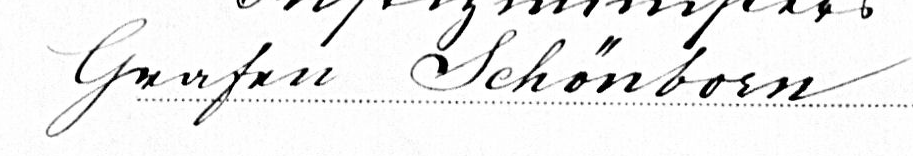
Grafen Schöborn
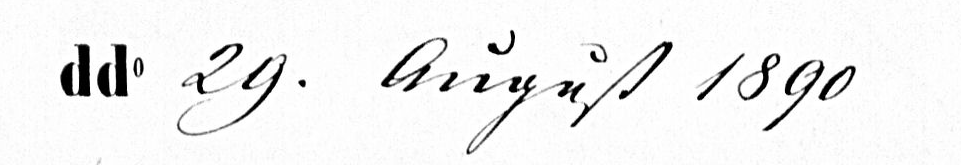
dd° 29. August 1890
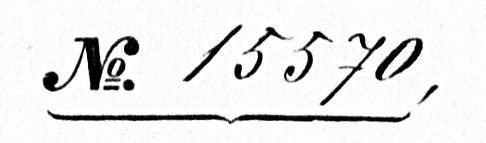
N° 15570,
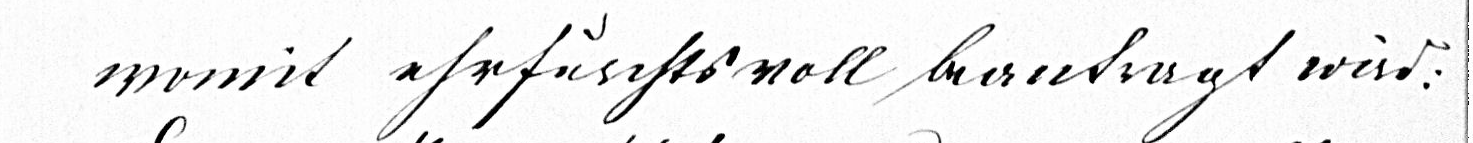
womit ehrfurchtsvoll beantragt wird:
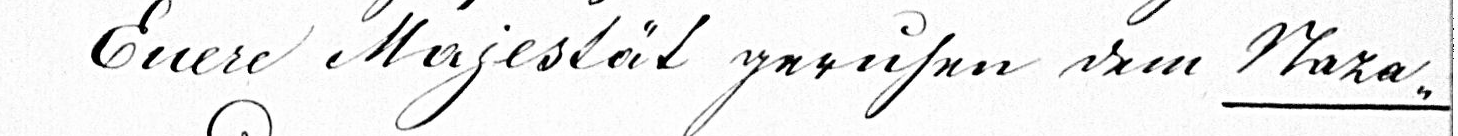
Euere Majestät geruhen dem Naza¬
